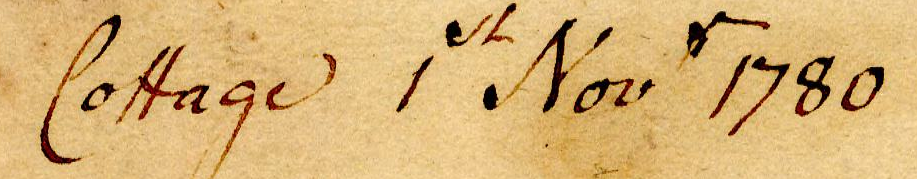Cottage 1^st Nov^r 1780
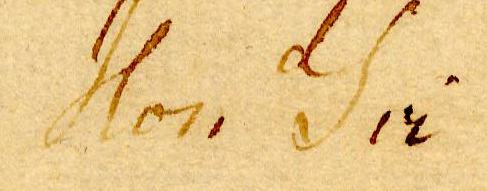Hon.^d Sir
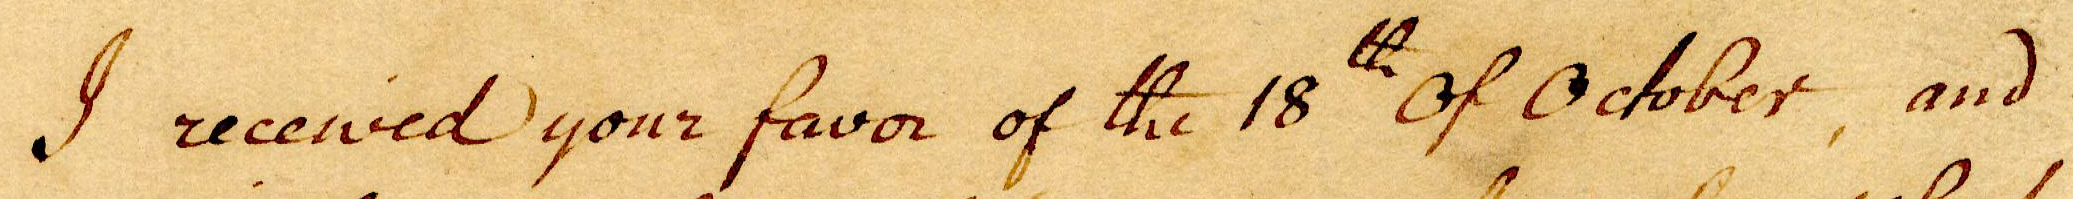I received your favor of the 18^th of October, and
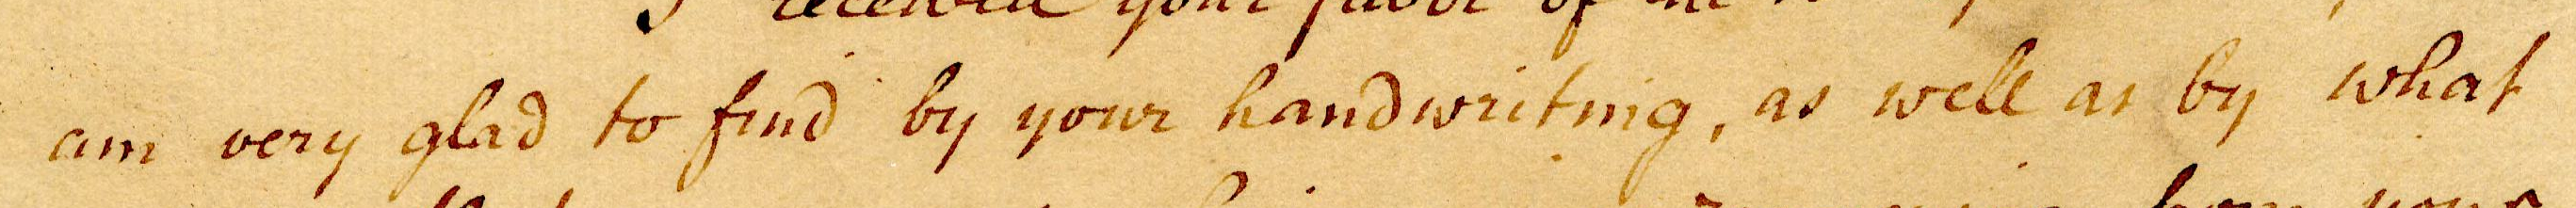am very glad to find by your handwriting, as well as by what
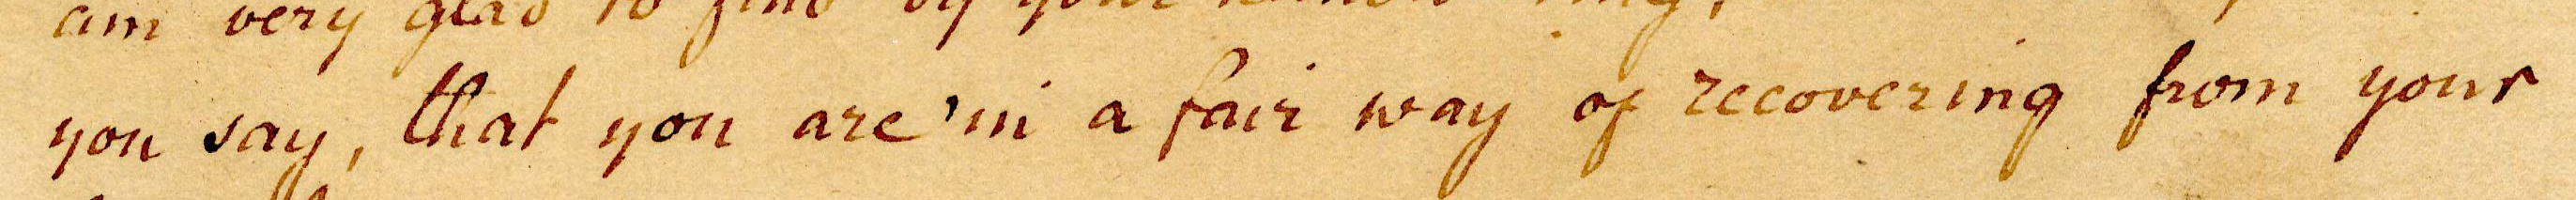you say, that you are in a fair way of recovering from your
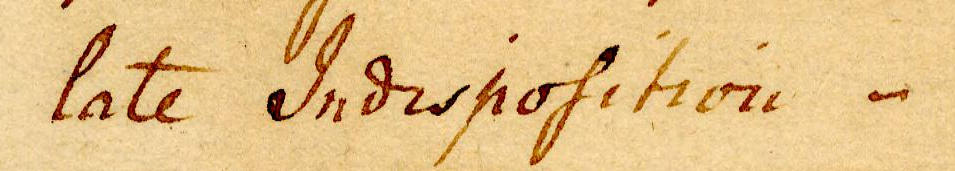late Indisposition-
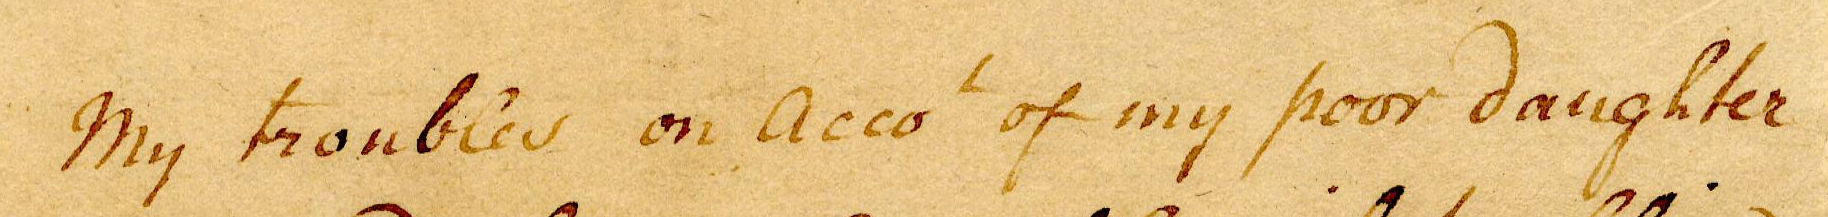My troubles on Acco^t of my poor daughter
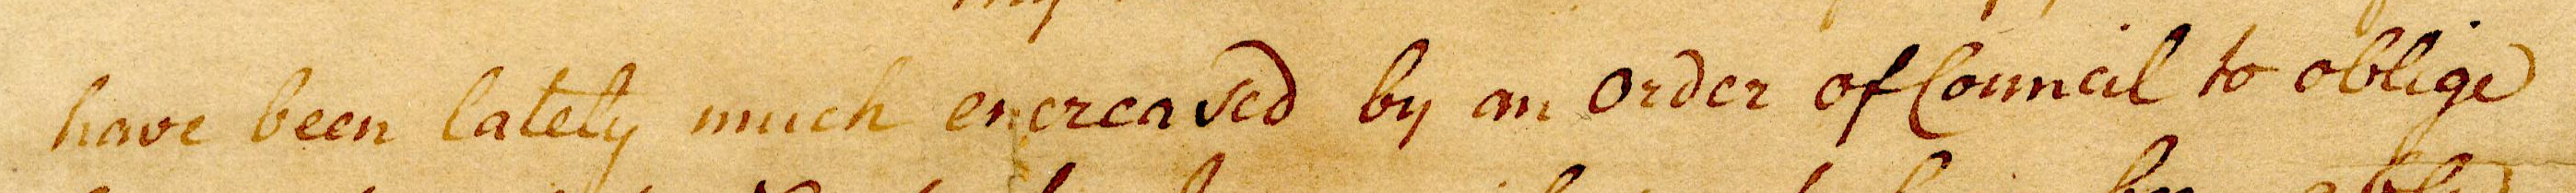have been lately much encreased by an Order of Council to oblige
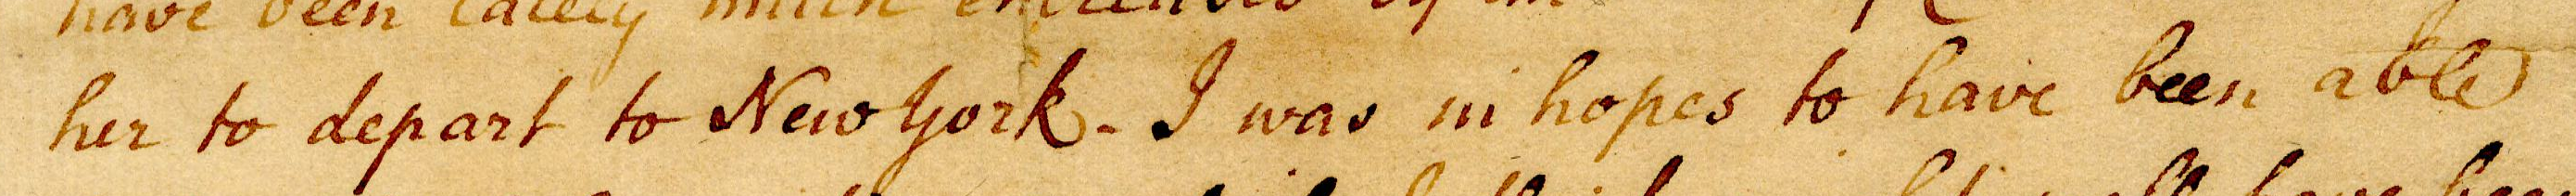her to depart to New York- I was in hopes to have been able
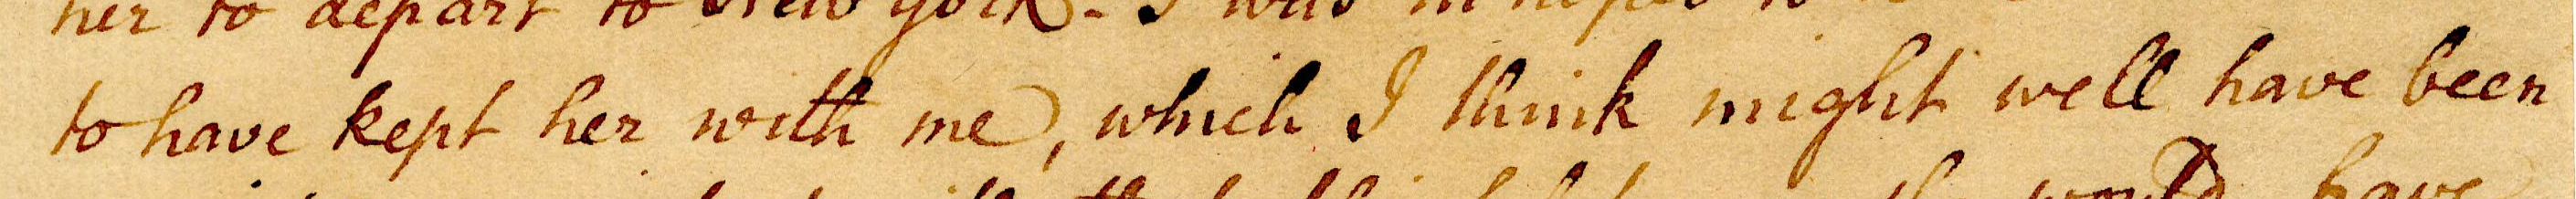to have kept her with me, which I think might well have been
